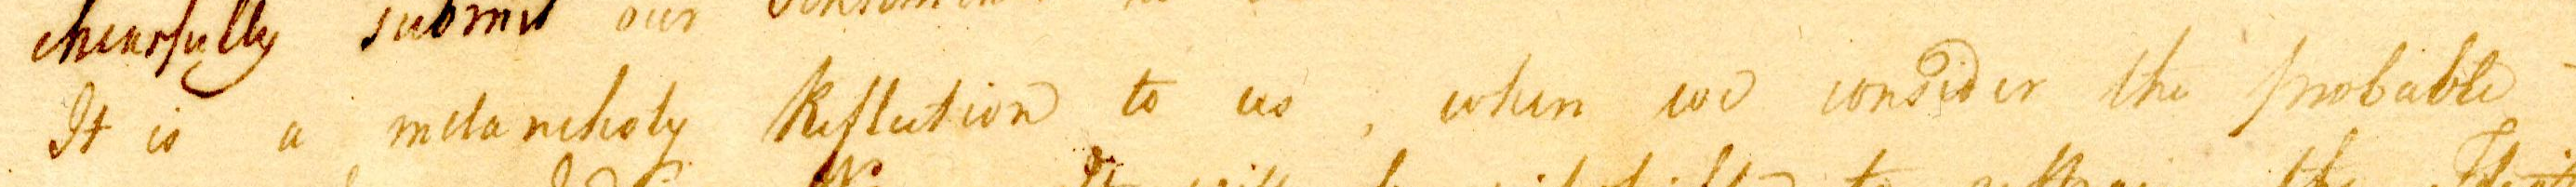It is a melancholy Reflection to us, when we consider the probable
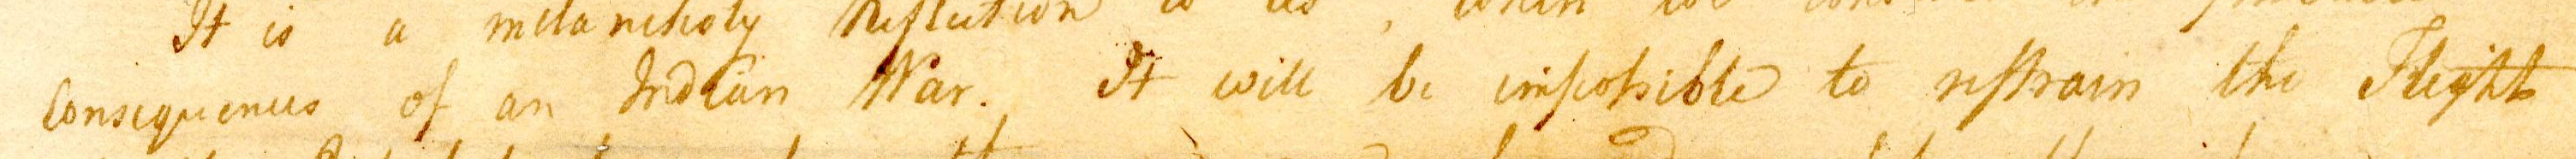Consequences of an Indian War. It will be impossible to restrain the Flight
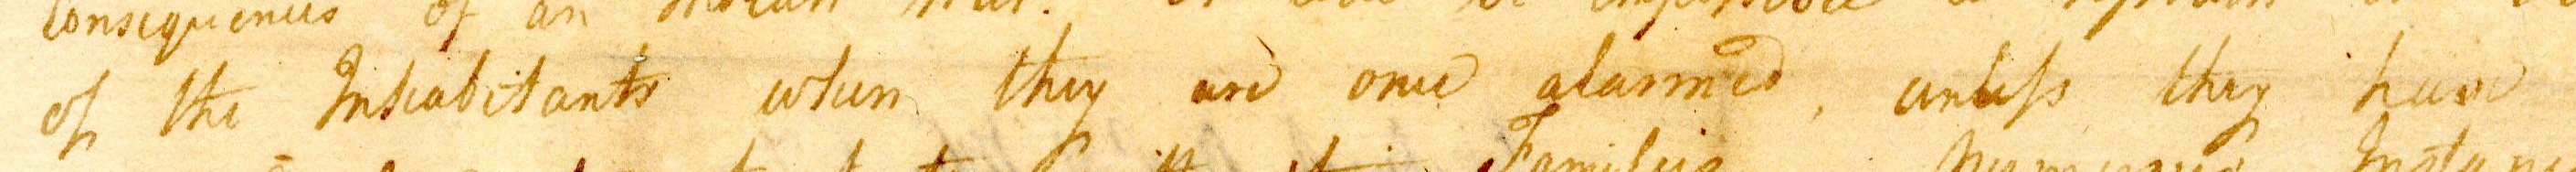of the Inhabitants when they are once alarmed unless they have
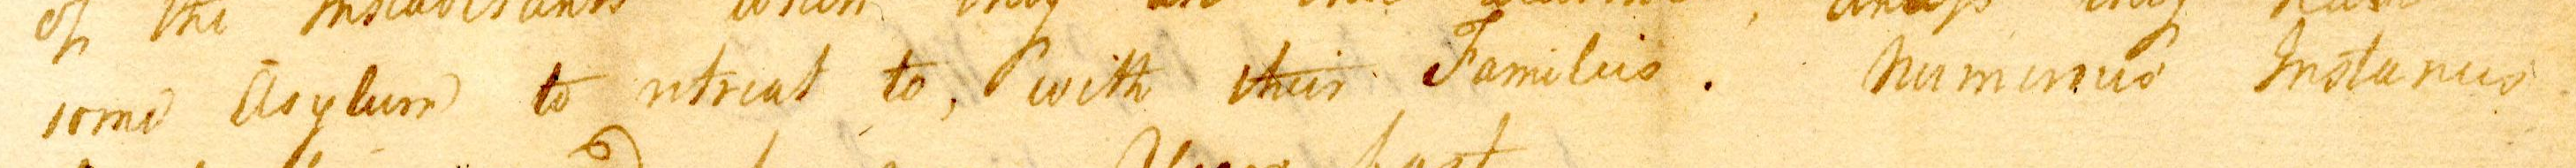some Asylum to retreat to, with their Families. Numerous Instances
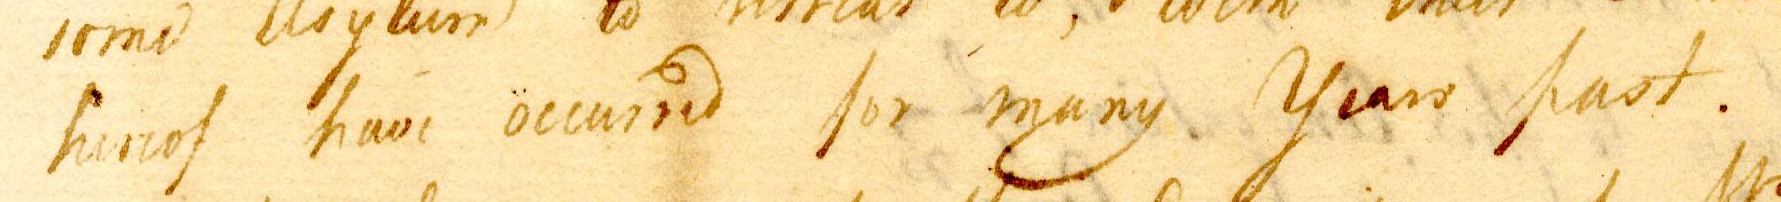hereof have occurred for many Years past.
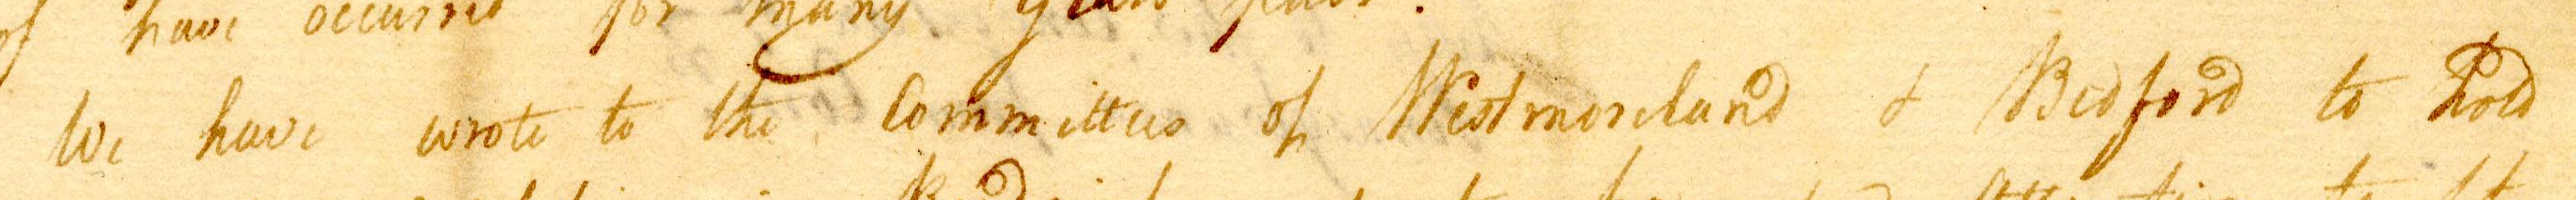We have wrote to the Committees of Westmoreland & Bedford to hold
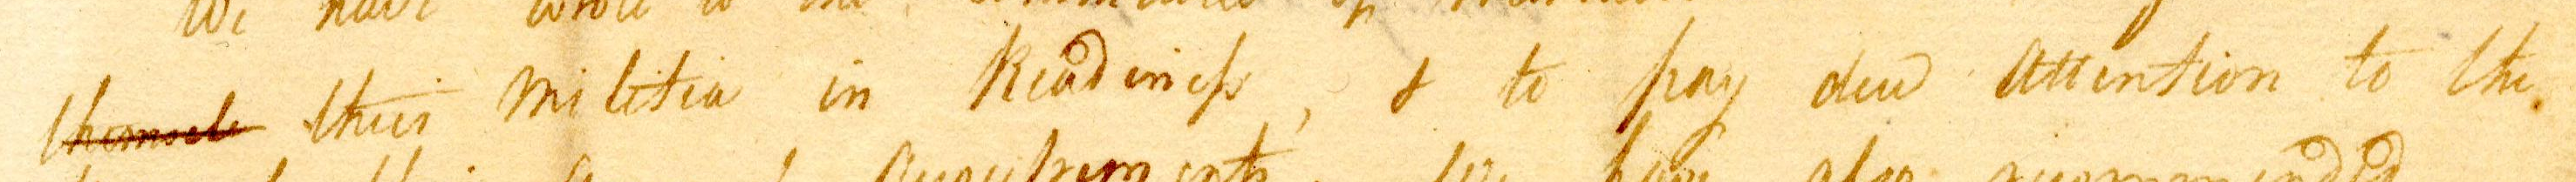themselves their Militia in Readiness, & to pay due Attention to the
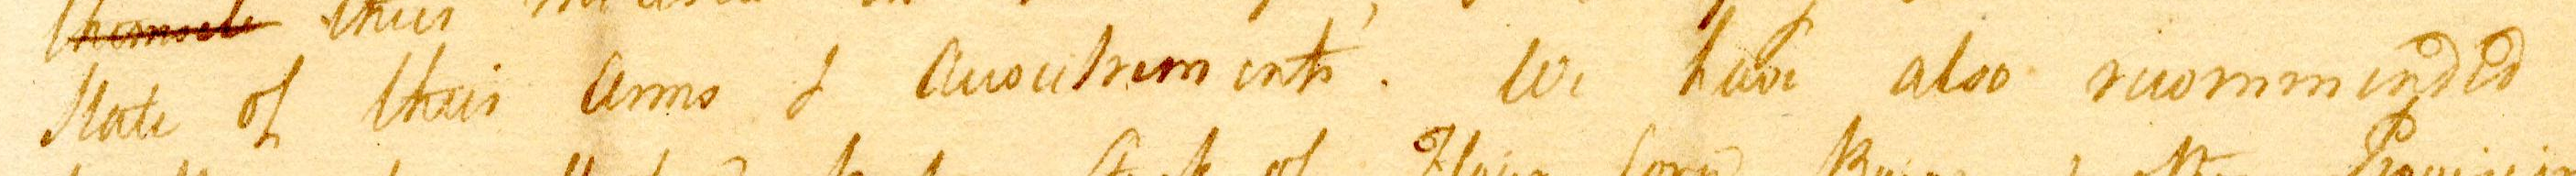State of their Arms & Accoutrements. We have also recommended
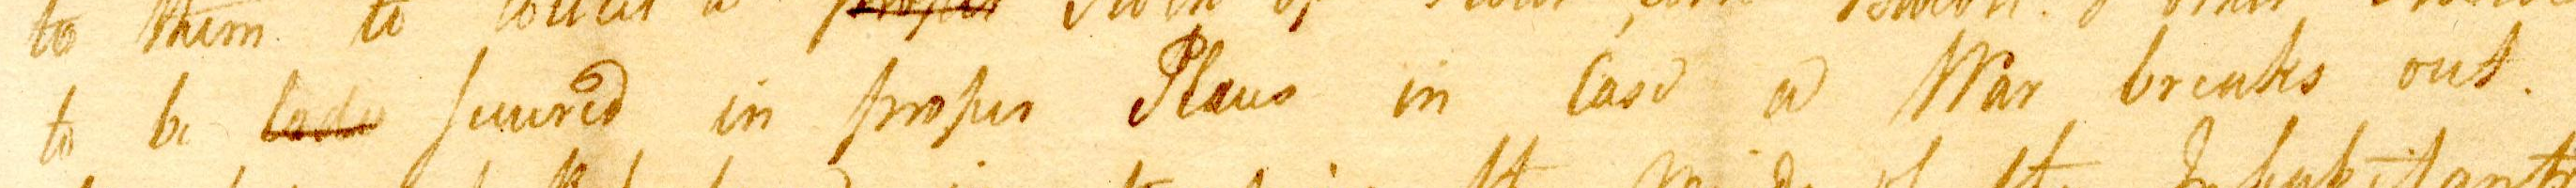to be lade secured in proper Places in Case a War breaks out.
